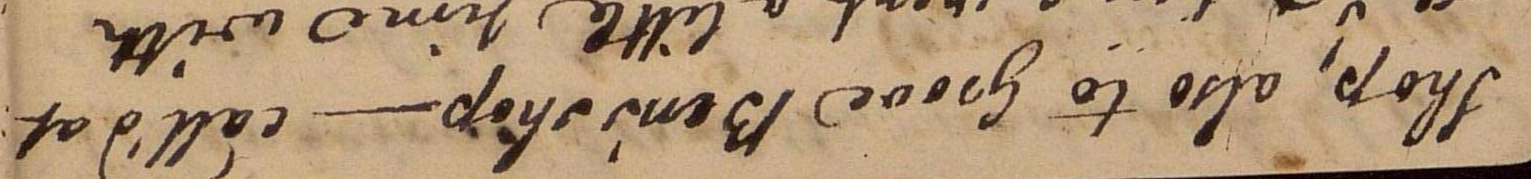Shop, also to Grove Ben's shop- call'd at
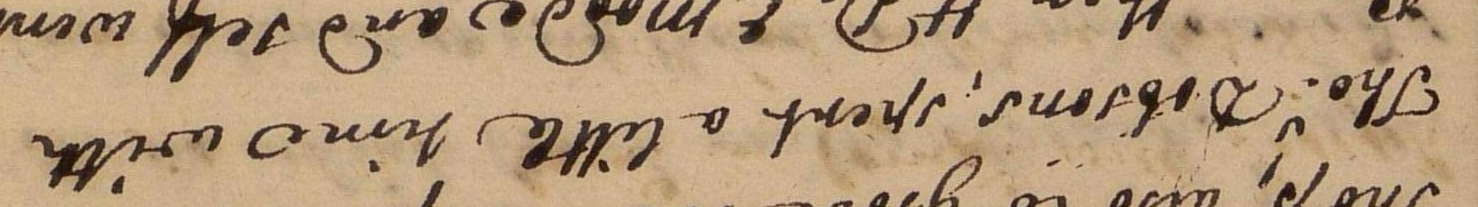Tho^s. Dobsons, spent a little time with
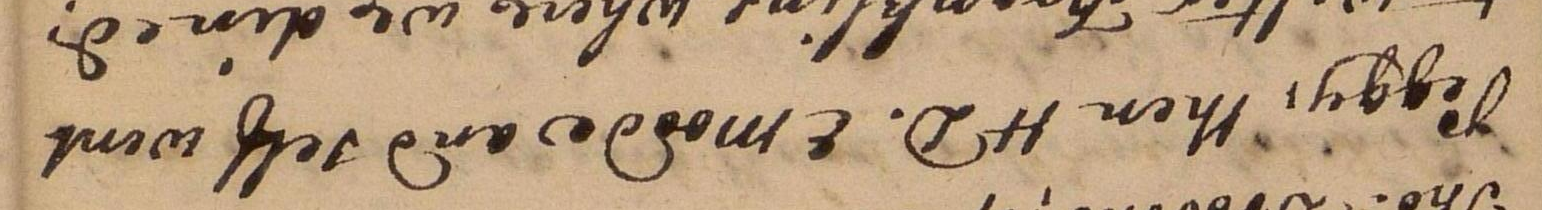Peggy, then HD. E Moode and self went
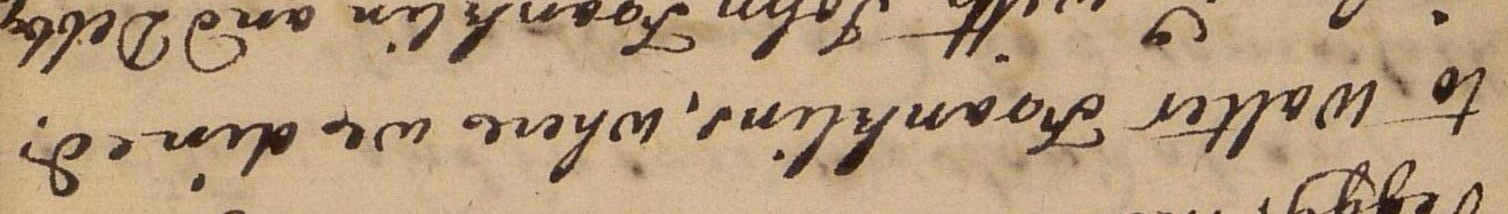to Walter Franklins, where we dined.
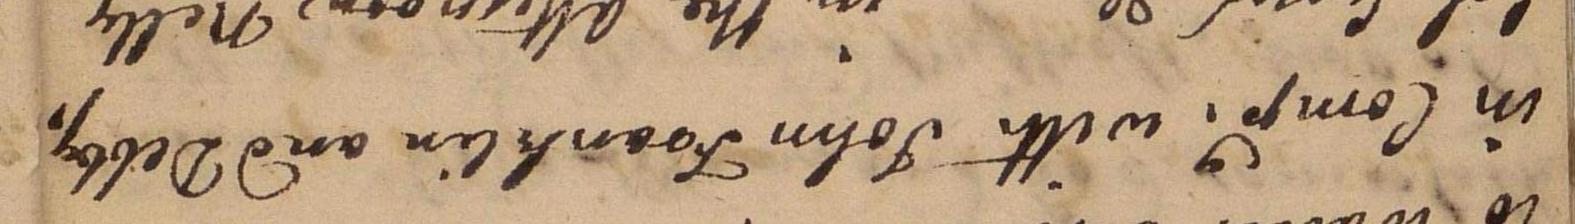in Comp^y. with John Franklin and Debby.
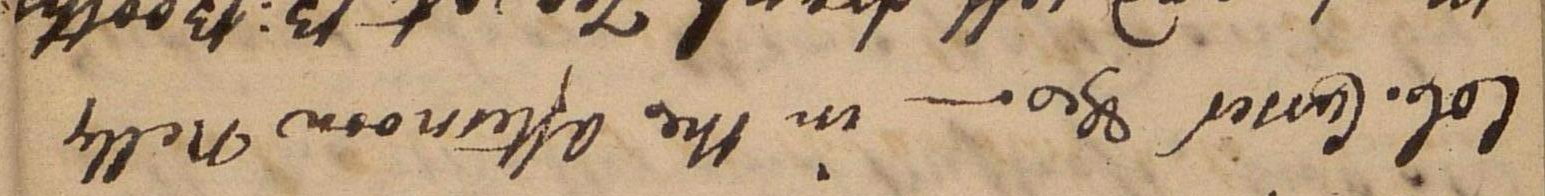Col. Casser &c- in the Afternoon Nelly
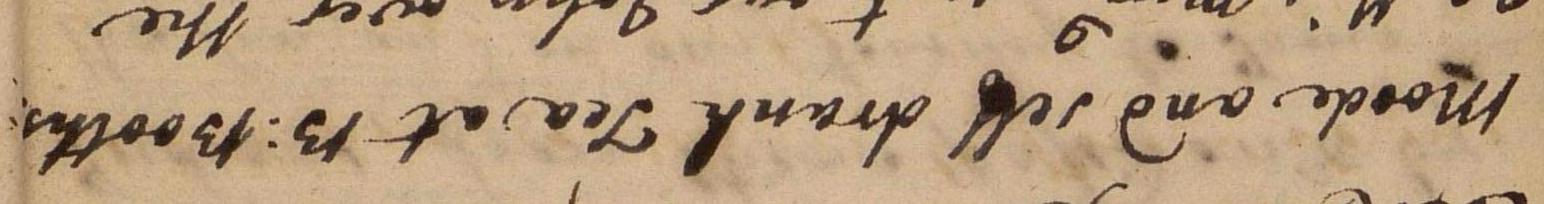Moode and self drank Tea at B: Booths
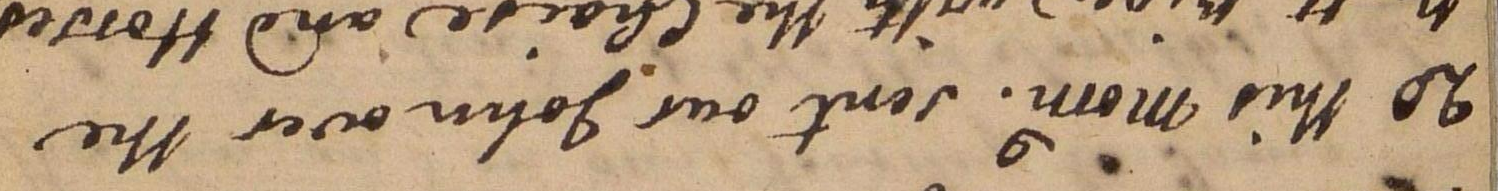20 this morn^g. sent our John over the
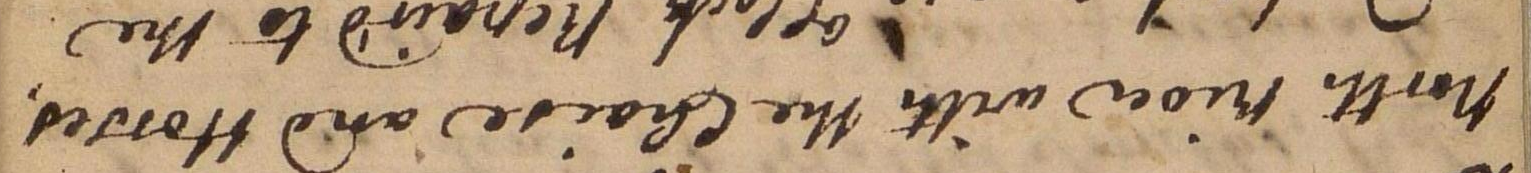North River with the Chaise and Horses,
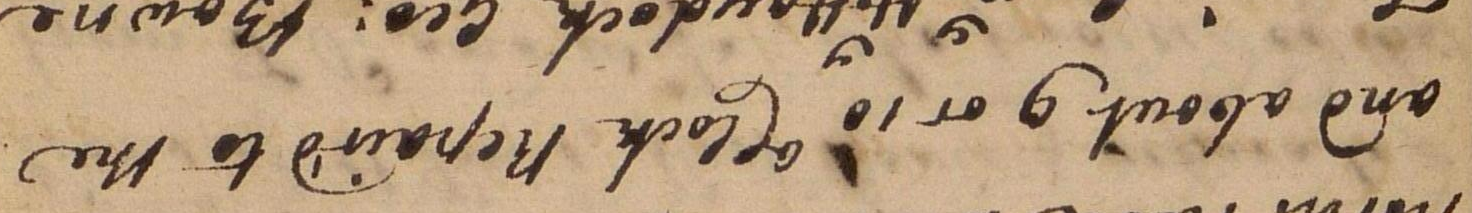and about 9 or 10 ^oClock Repair'd to the
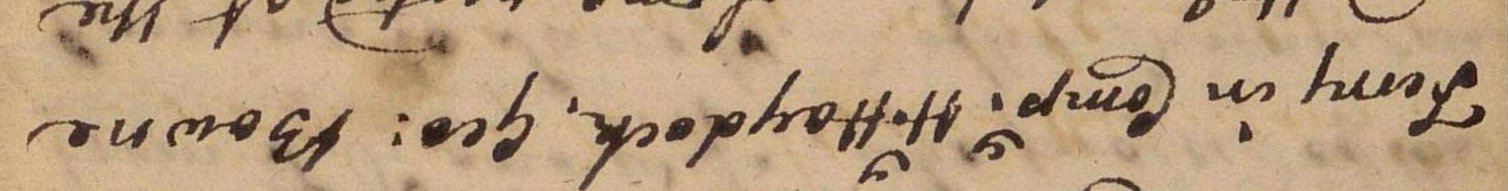Ferry in Comp^y. H^y. Haydock, Geo: Bowne
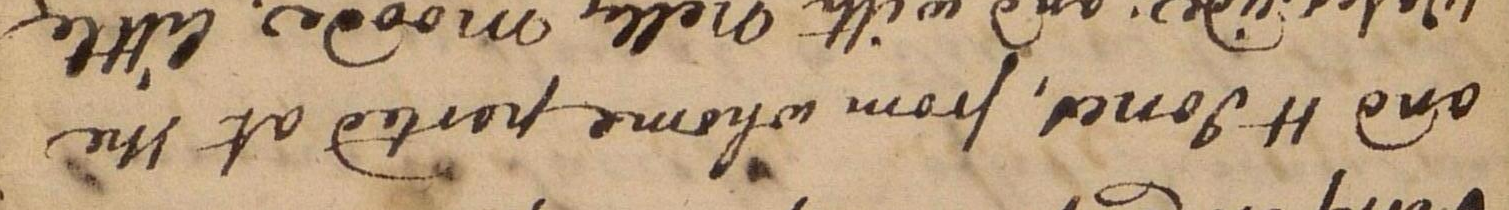and H Jones from whome parted at the
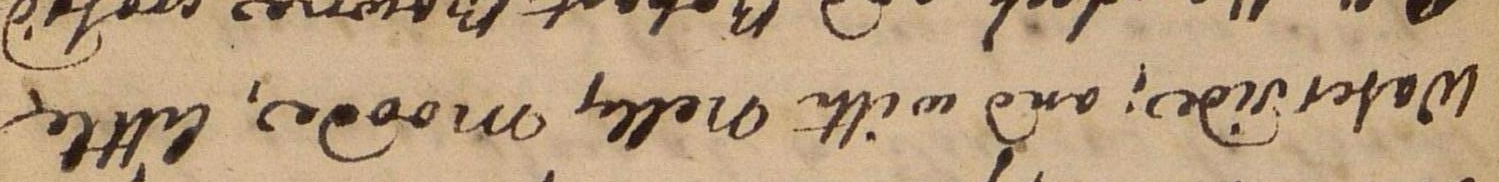Waterside; and with Nelly Moode, little
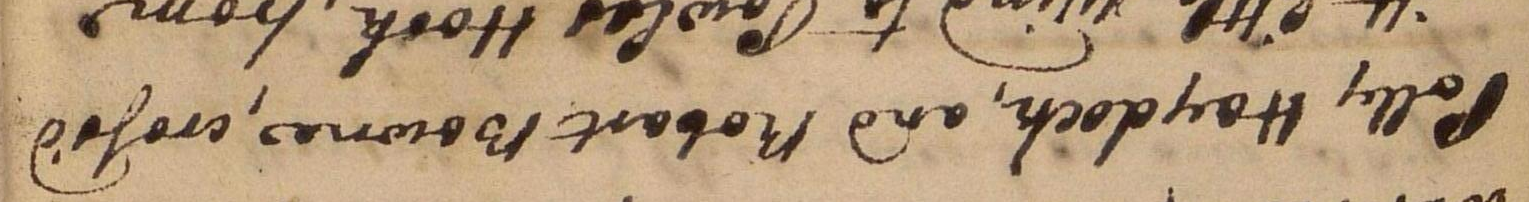Polly Haydock, and Robart Bowne, cross'd
